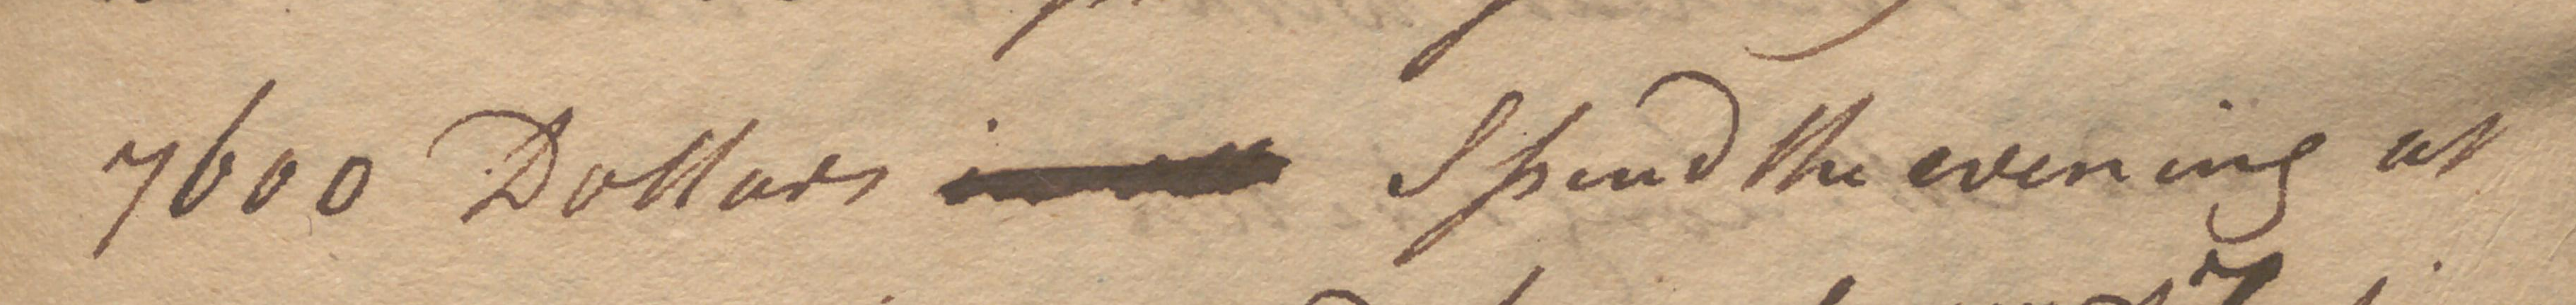7600 Dollars [_____] Spend the evening at
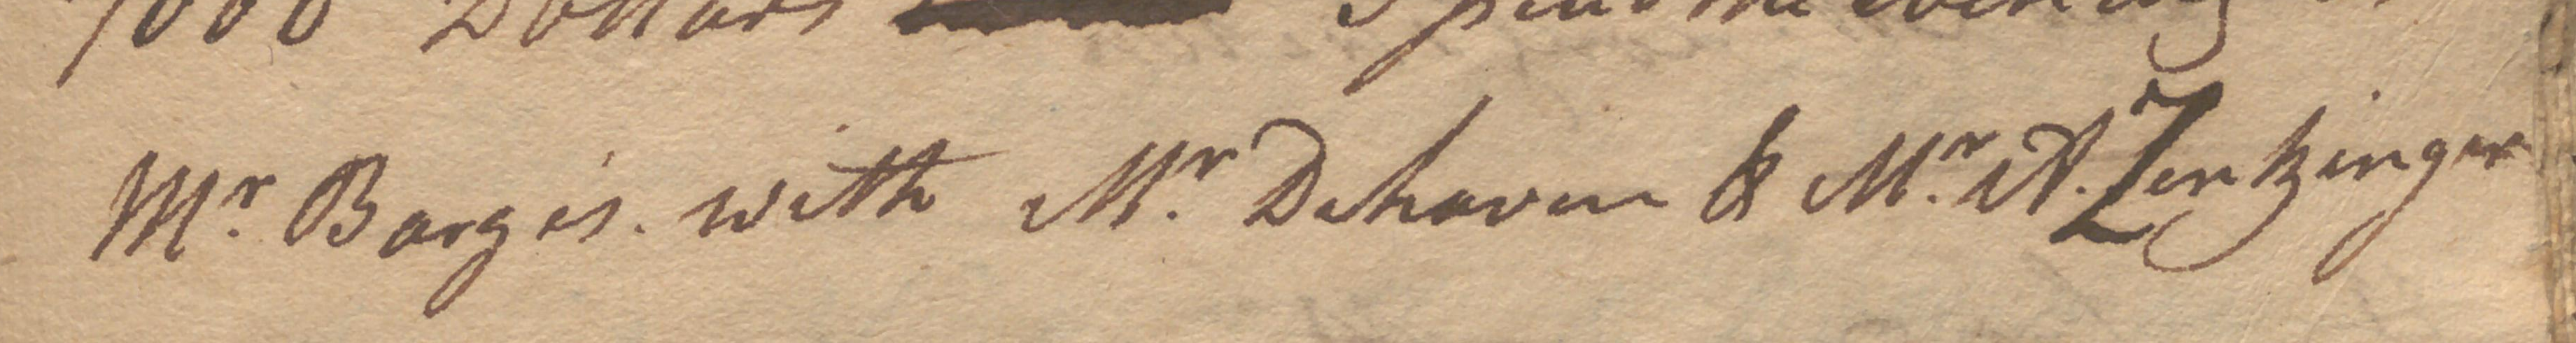M^r Barge's with M^r. Dehavan & M^r. A Zentzinger
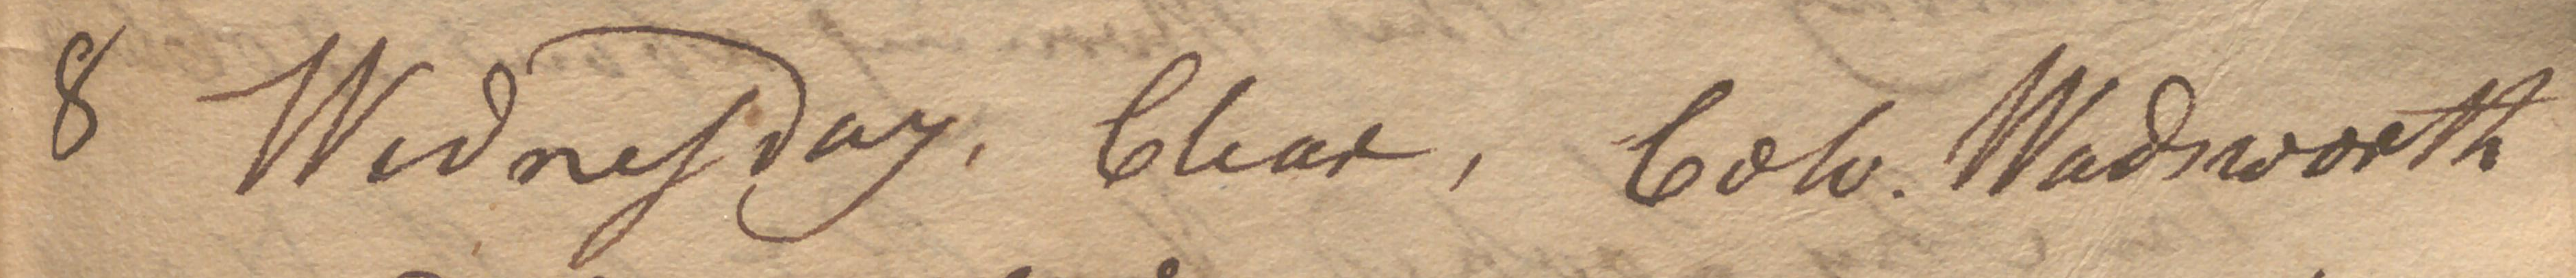8 Wednesday. Clear, Colo. Wadsworth
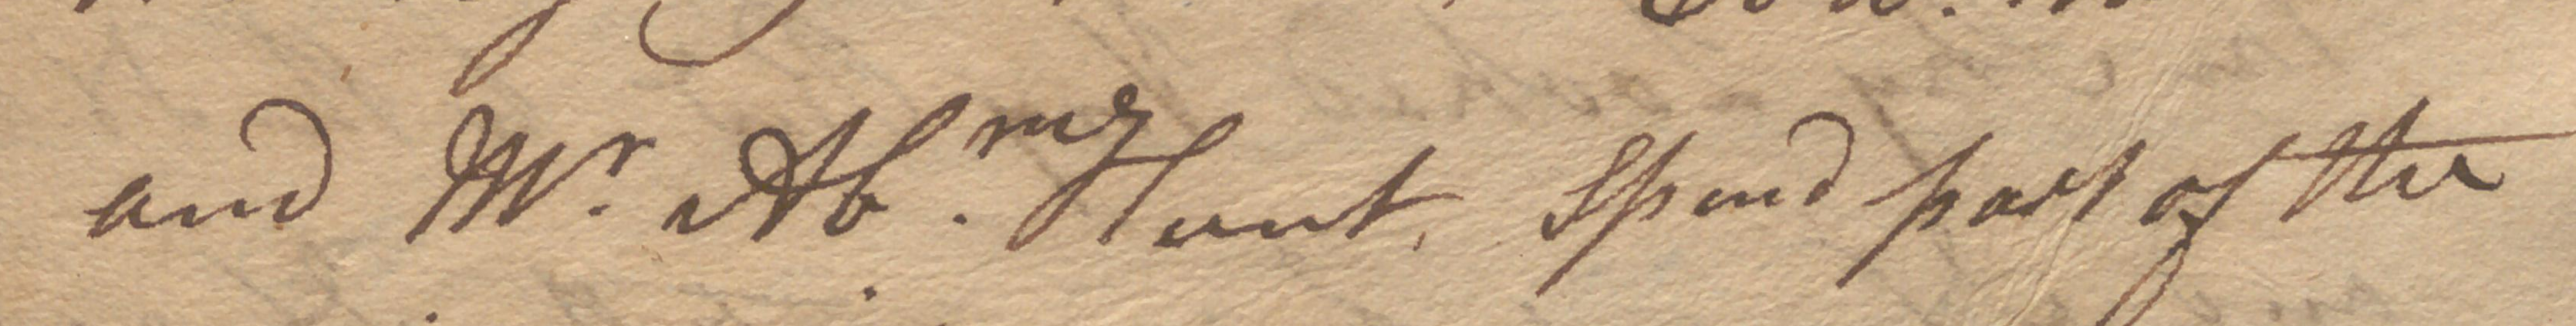and M^r. Ab^m. Hunt spend part of the
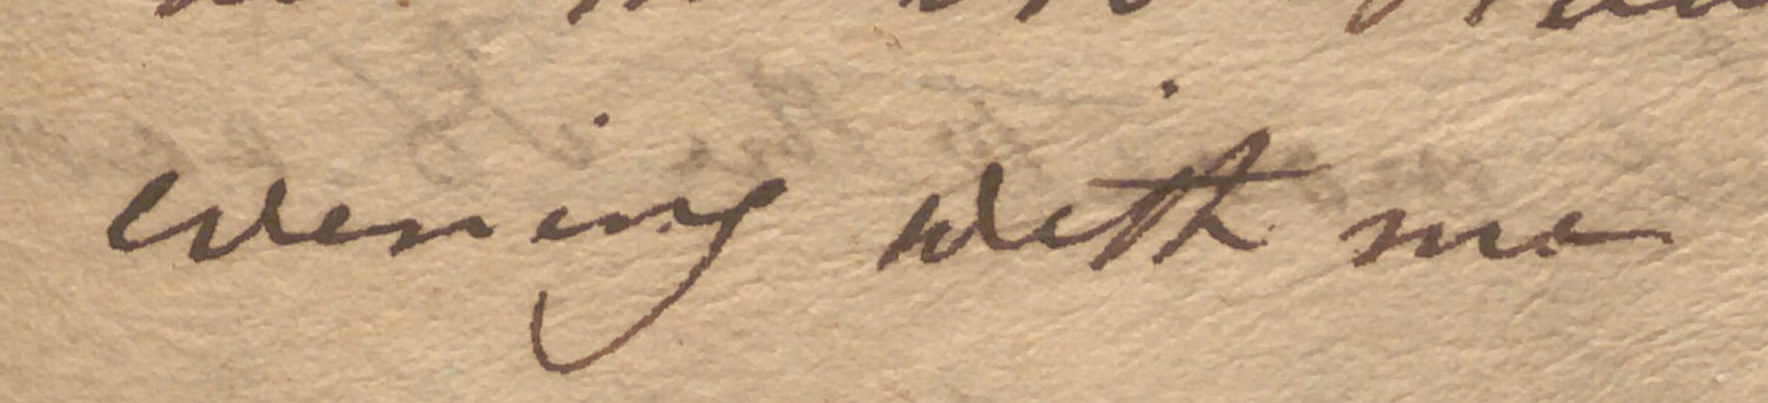evenng with me
